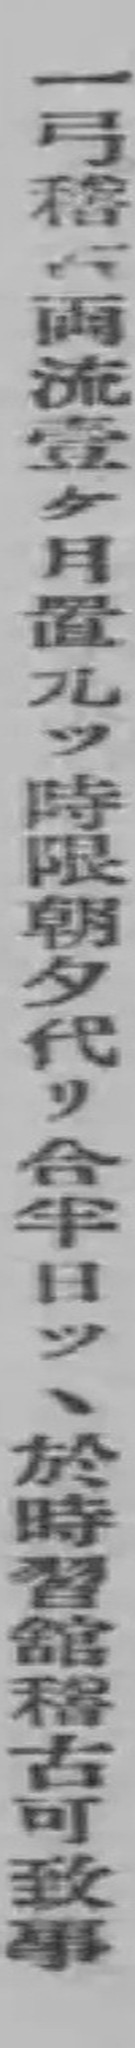一弓稽古両流壱ケ月置九ツ時限朝夕代リ合半日ツヽ於時習館稽古可致事
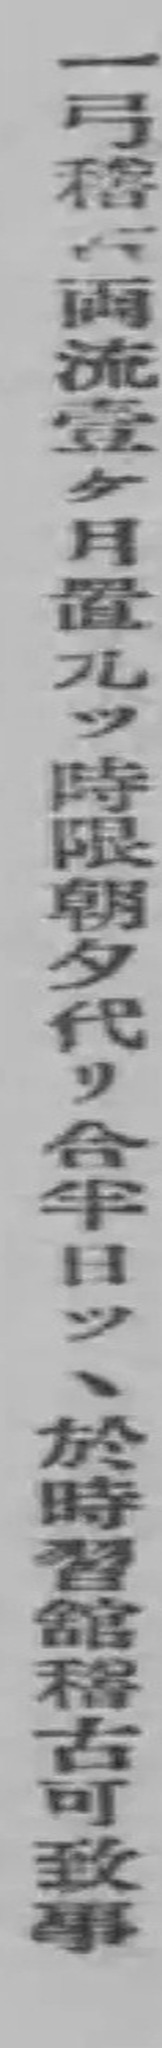一弓稽古両流壱ケ月置九ツ時限朝夕代リ合半日ツヽ於時習館稽古可致事
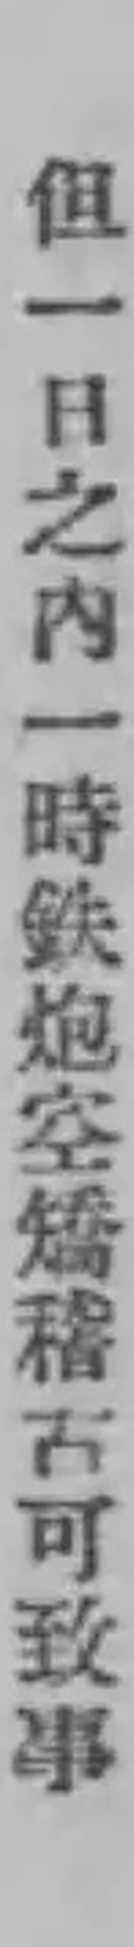但一日之内一時鉄炮空矯稽古可致事
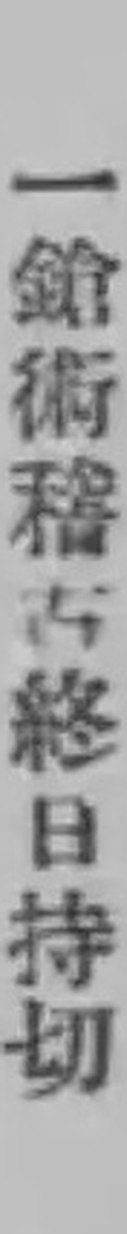一鎗術稽古終日持切
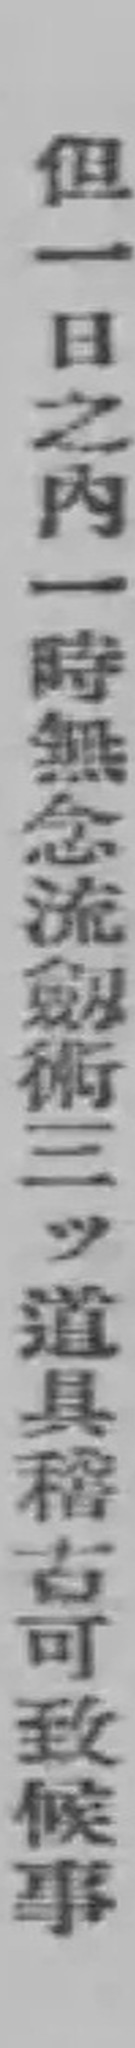但一日之内一時無念流釼術三ツ道具稽古可致候事
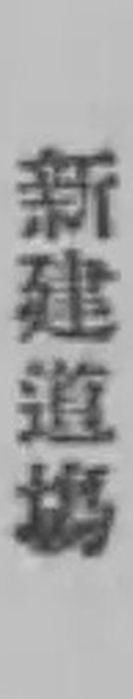新建道場
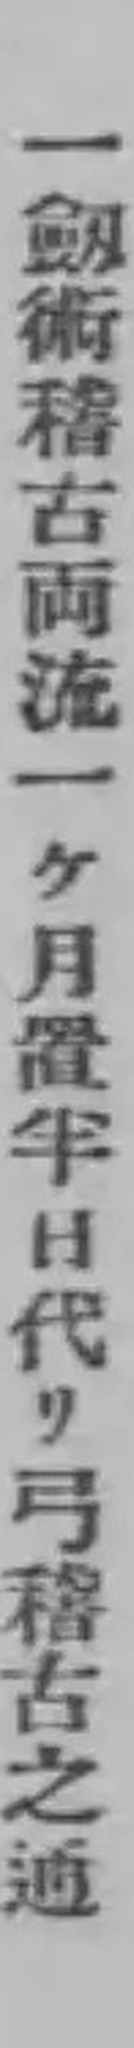一釼術稽古両流一ケ月置半日代リ弓稽古之通
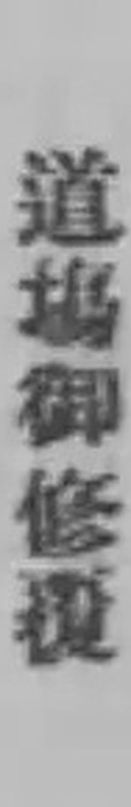道場御修復
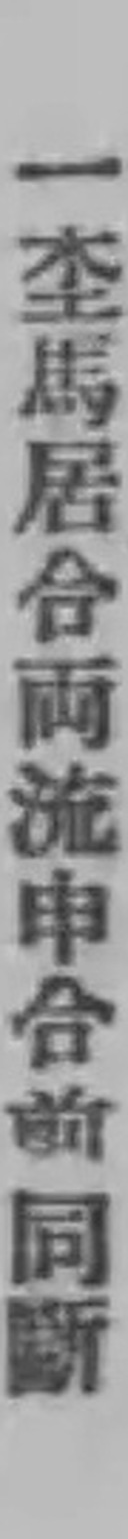一杢馬居合両流申合前同断
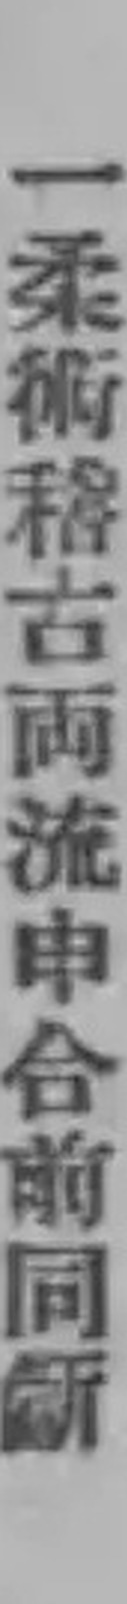一柔術稽古両流申合前同断

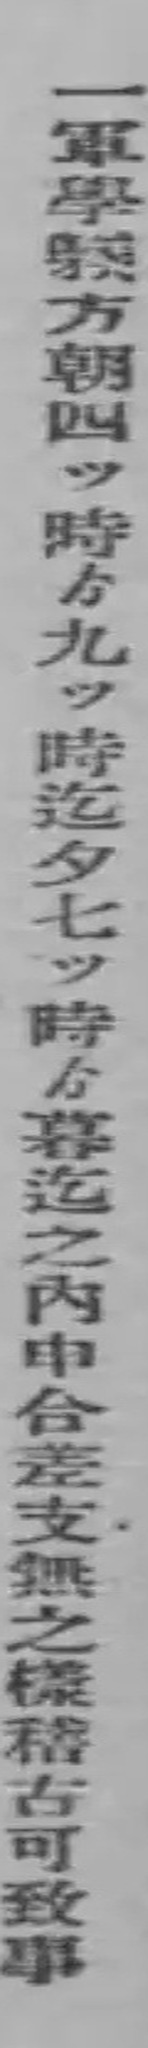一軍学躾方朝四ツ時ゟ九ツ時迄夕七ツ時ゟ暮迄之内申合差支無之様稽古可致事
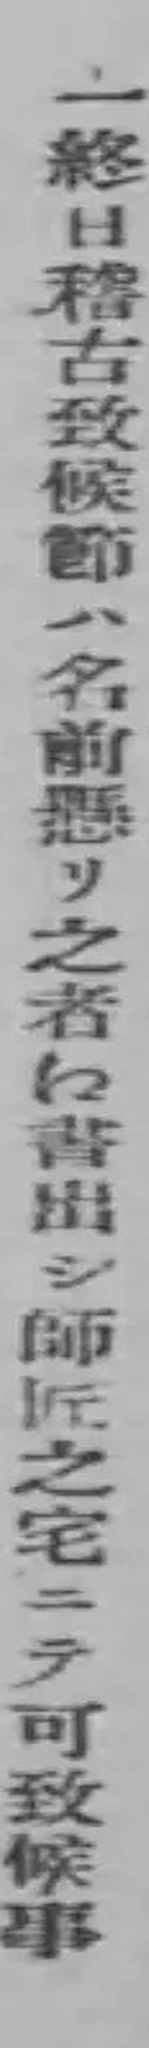一終日稽古致候節ハ名前懸り之者え書出シ師匠之宅ニテ可致候事
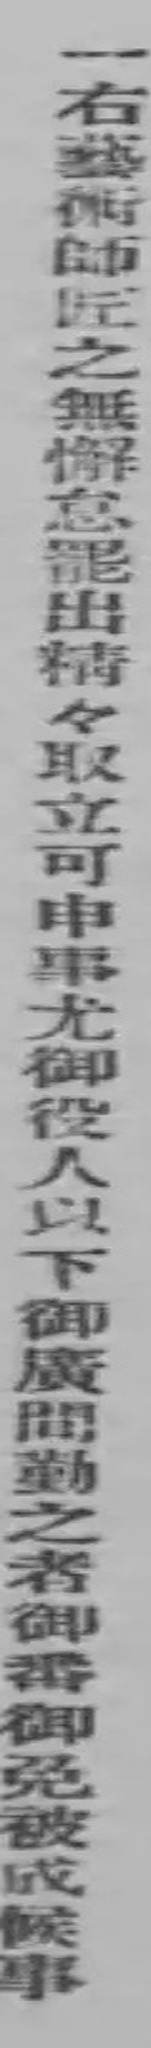一右芸術師匠之無懈怠罷出精々取立可申事尤御役人以下御広間勤之者御番御免被成候事
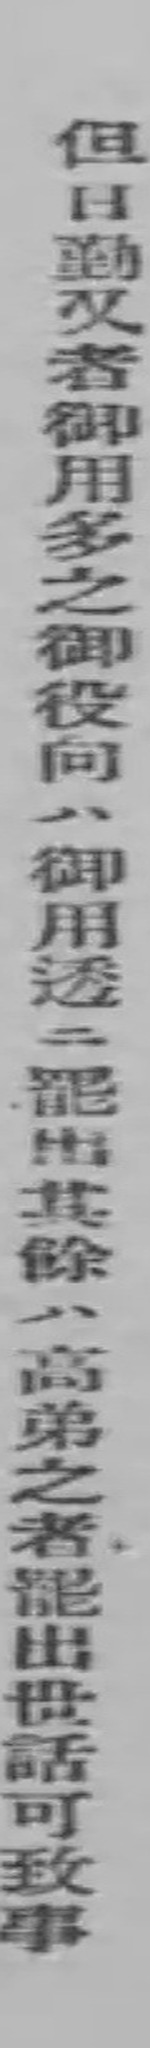但日勤又者御用多之御役向ハ御用透ニ罷出其余ハ高弟之者罷出世話可致事
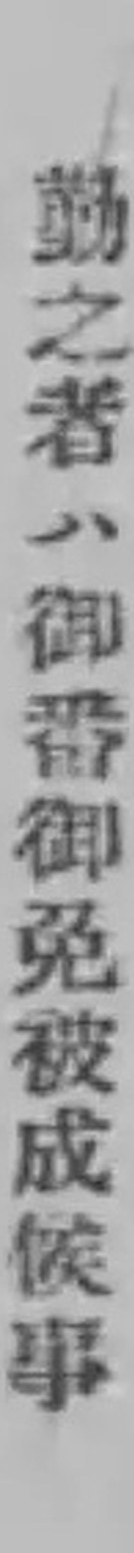勤之者ハ御番御免被成候事
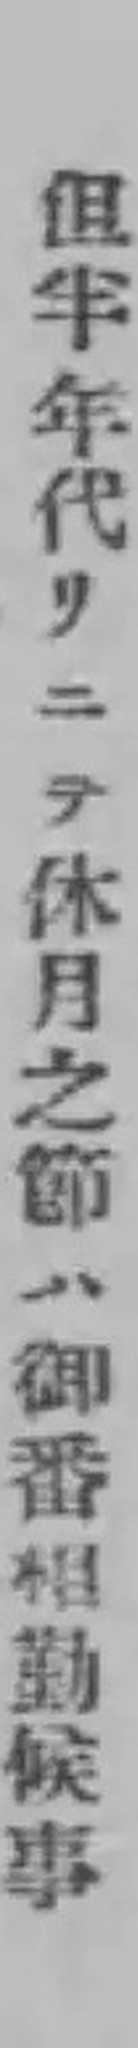但半年代リニテ休月之節ハ御番相勤候事
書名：豊橋市史談
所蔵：国立国会図書館 National Diet Library, JAPAN
